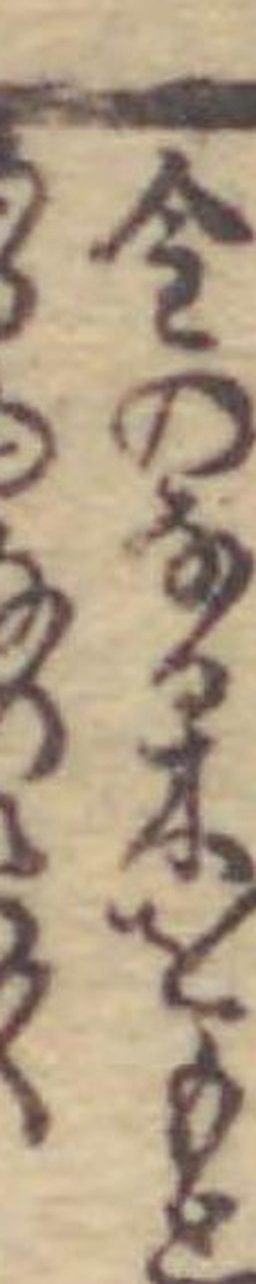めるもなのたかく
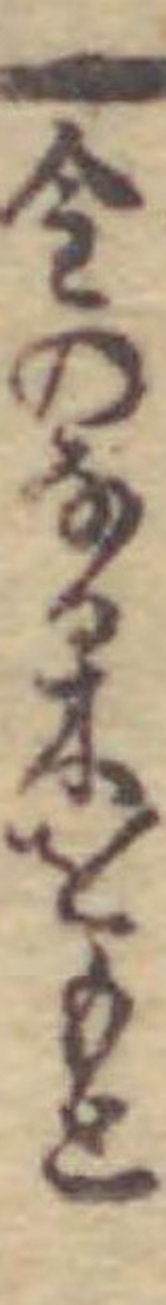金のなる木をもと
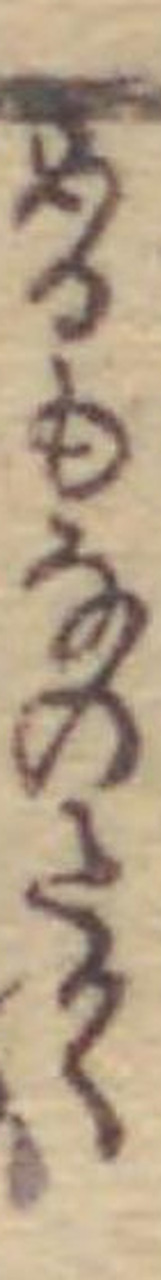めるもなのたかく
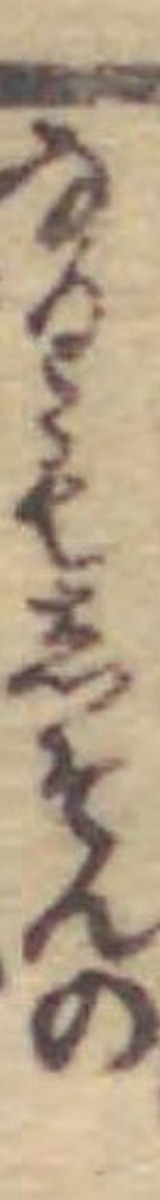なるもしそんの
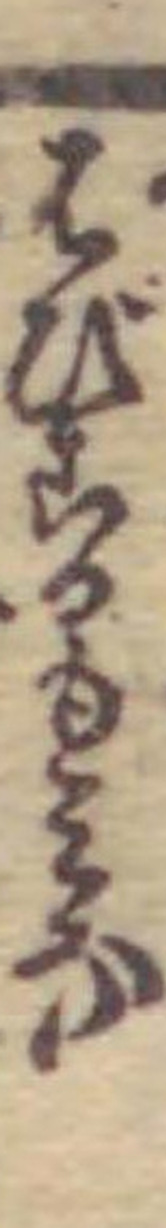はびこるもみな
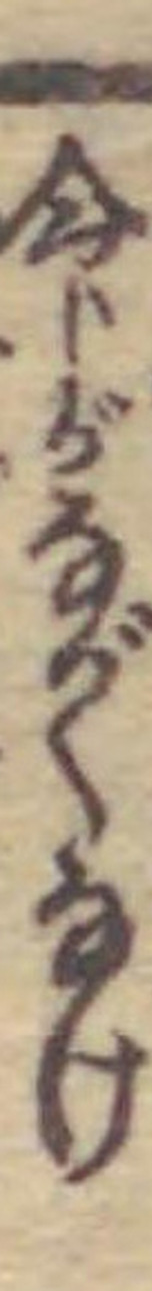命がながくなけ
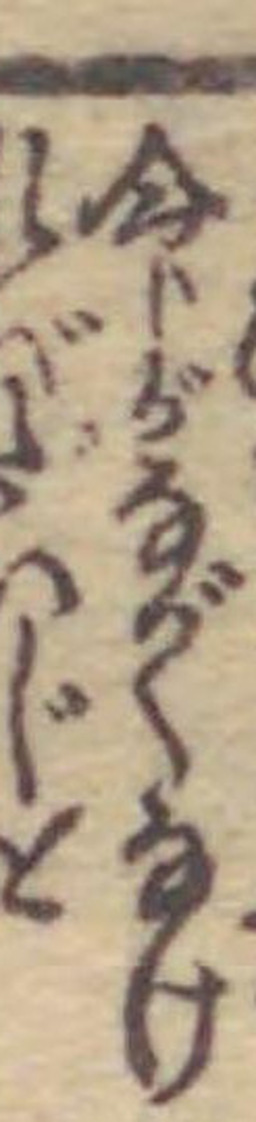ればだいじを
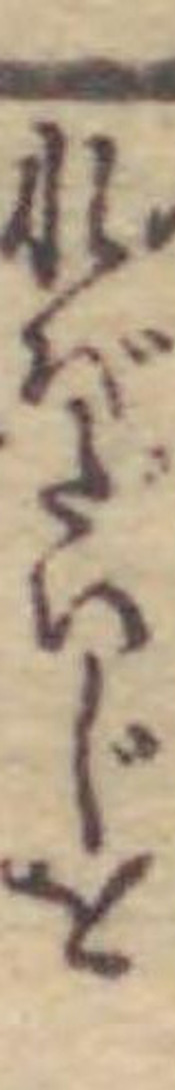ればだいじを
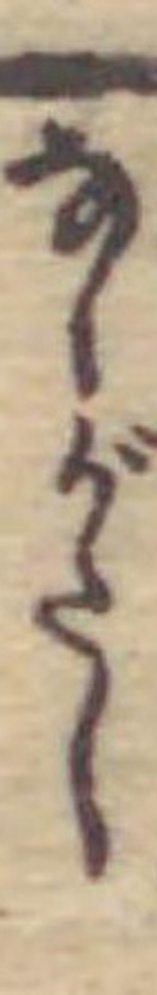なしがたし
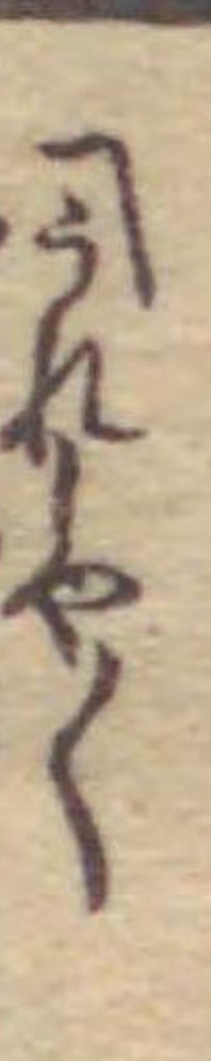〽うれしや〳〵
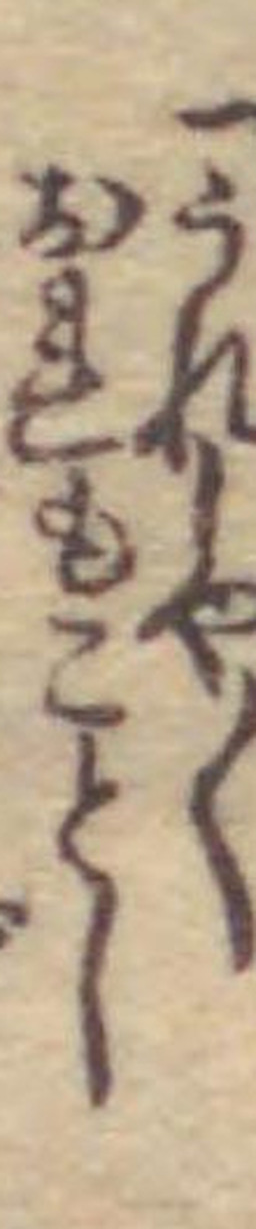おれもことし
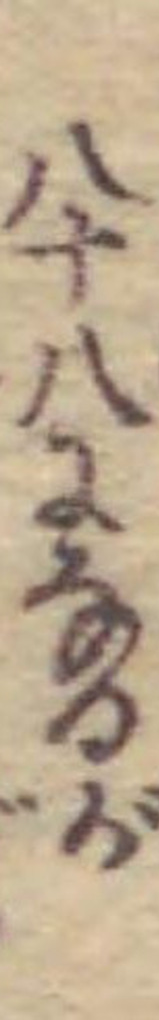八十八になるが
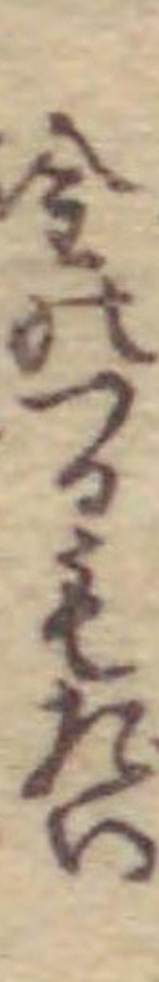金のつるもだい
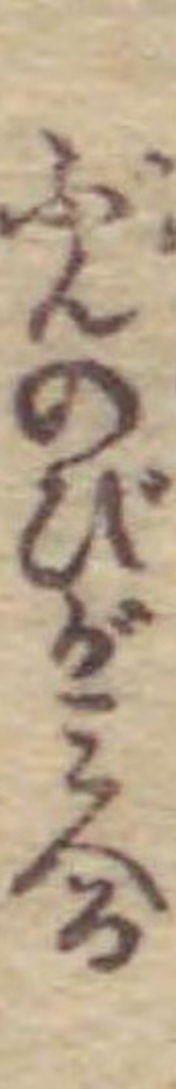ぶんのびがみへる
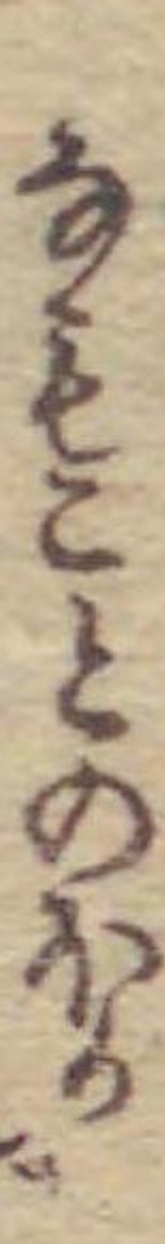なもことのほか
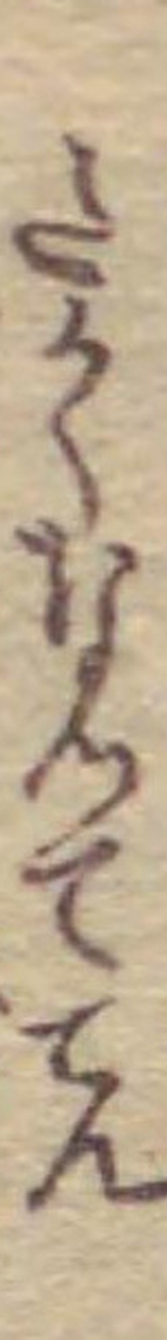たかくなつててん
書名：御誂染長寿小紋 : 3巻
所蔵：国立国会図書館 National Diet Library, JAPAN
